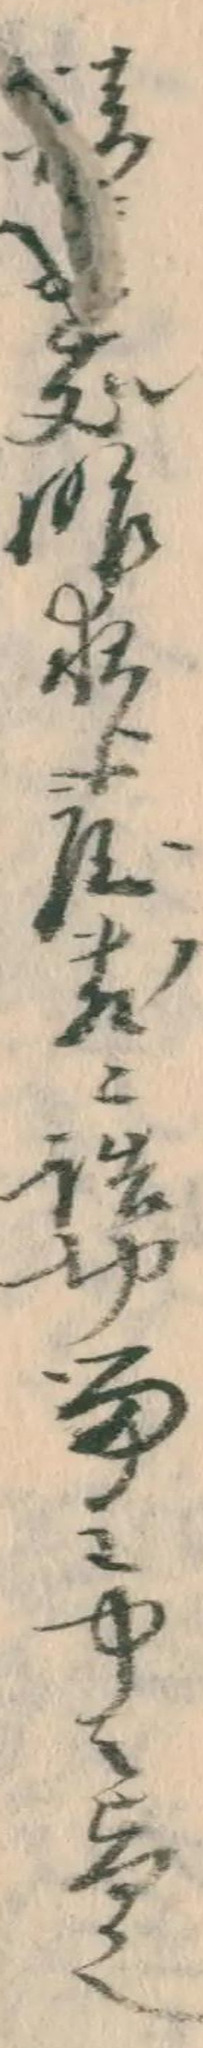遣処昨夜ゟ屋敷に詰切留主中之旨也
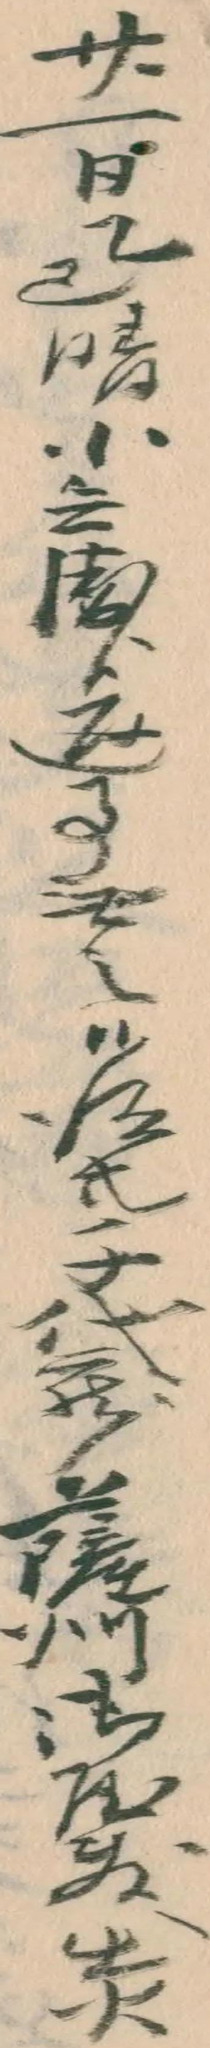廿一日乙巳晴小兵衛ゟ返事無之候得共千代蔵薩州御屋敷へ出火
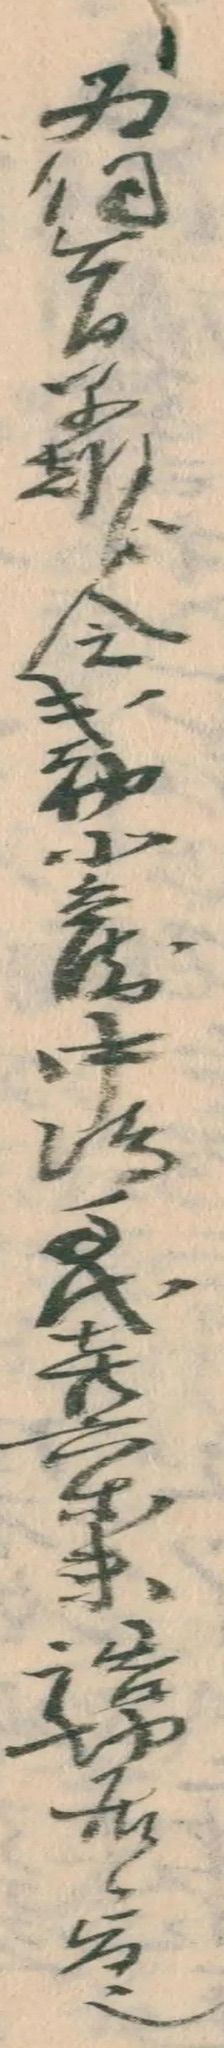為伺今日早朝ゟ令出勤小兵衛中嶋手代喜六等末詰切居候旨也
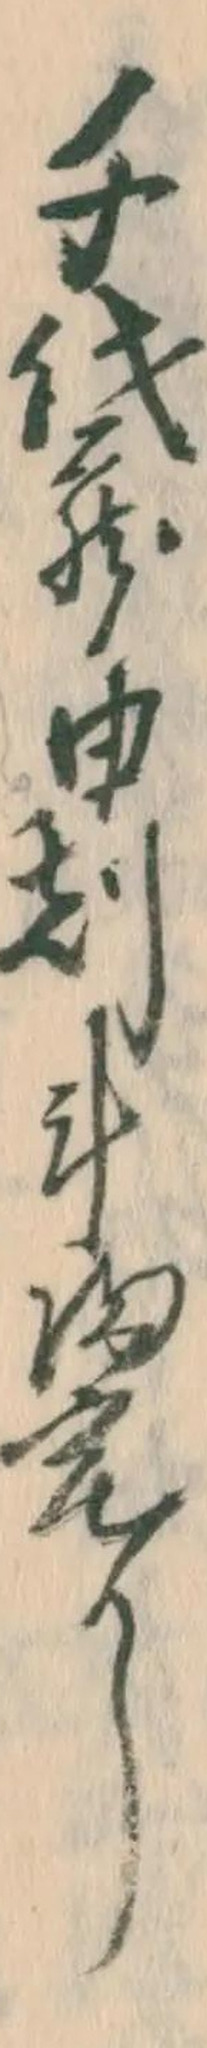千代蔵申刻斗帰宅了
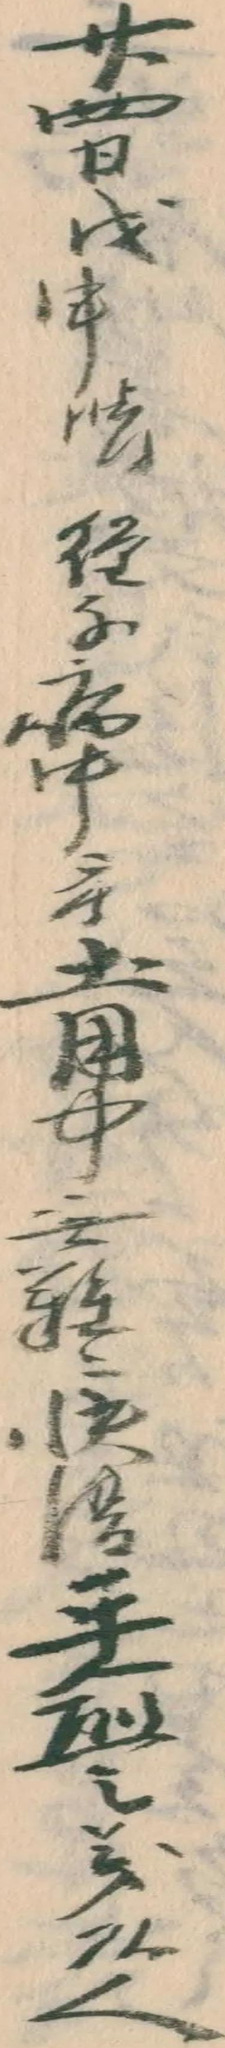廿四日戊申晴経千病中ニ付土用中無難に快復平癒之義頭人
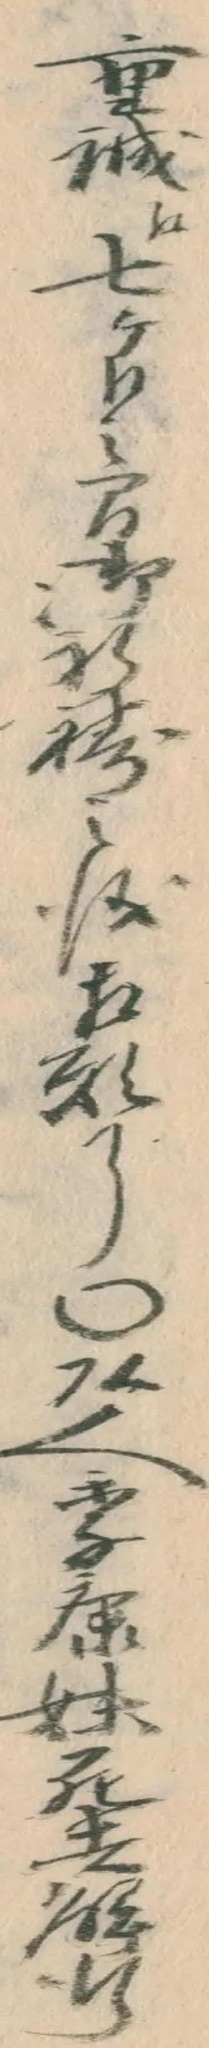重誠江七ヶ日之間御祈祷之儀相願了○頭人季康妹死去解行
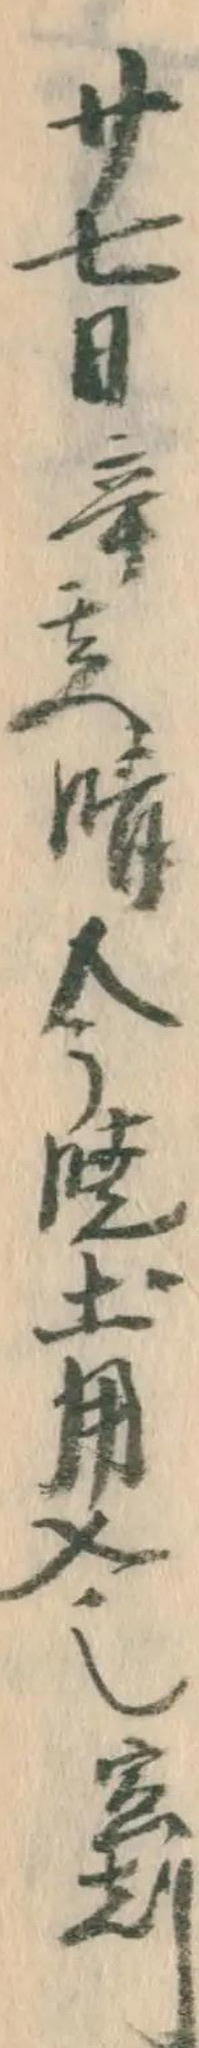廿七日辛亥晴今暁土用入也寅刻

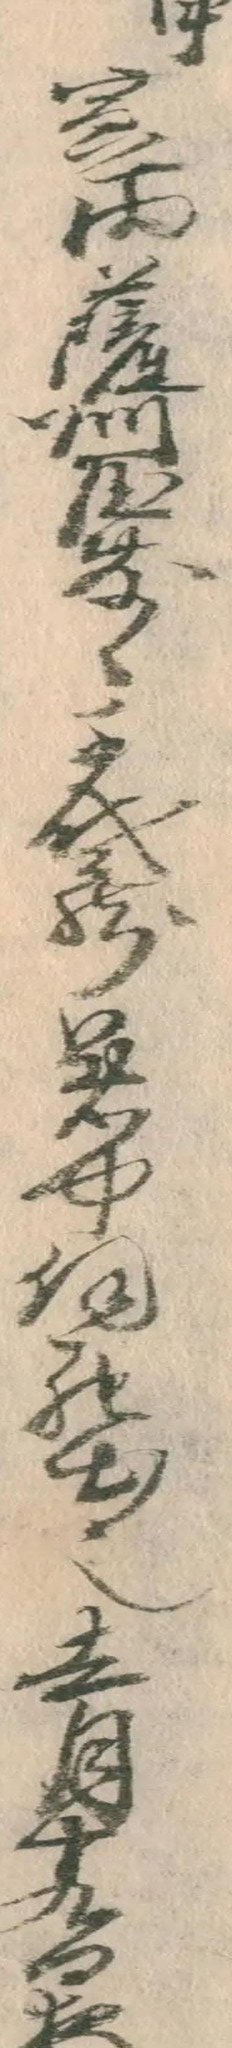朔日甲寅雨薩州屋敷へ千代蔵暑中伺罷出也去月十九日夜
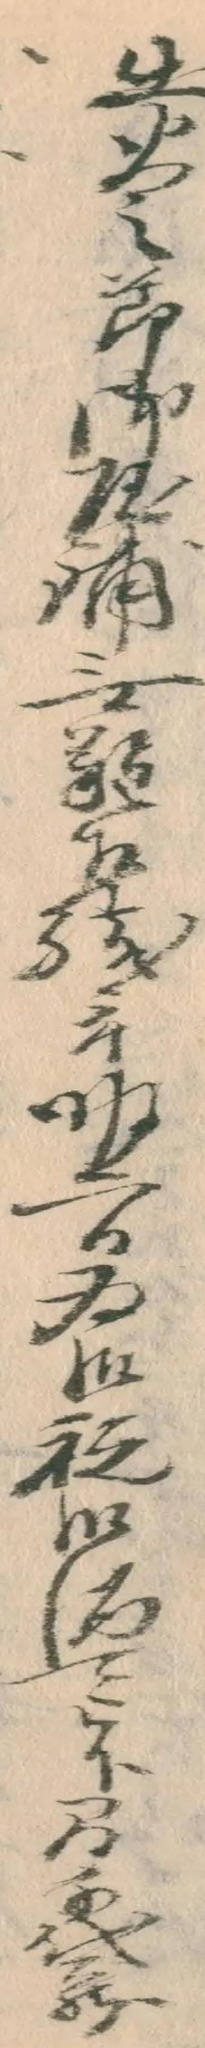出火之節御屋鋪無難相残ニ付明二日為御祝御酒可被下間千代蔵
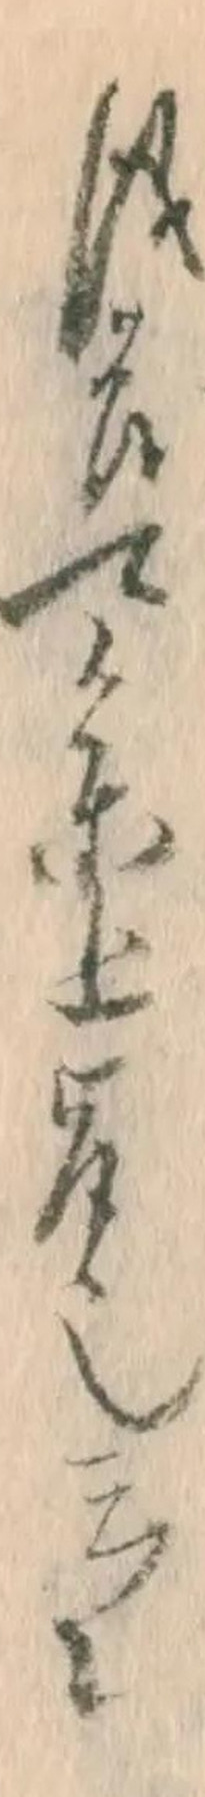儀も可参上旨也云々
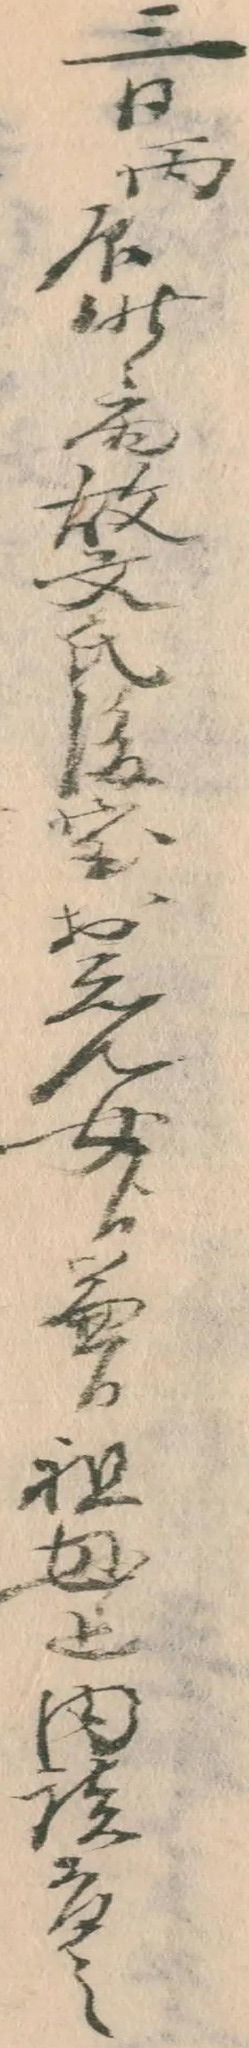三日丙辰時々雨故文氏後宝おめん女ゟ兼而祖母迄内談有之
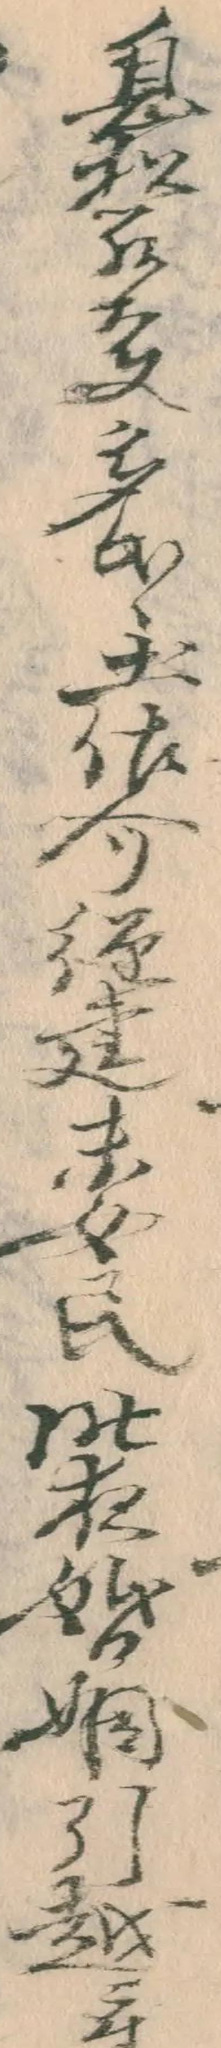息松若大夫多氏出佐介経建末女民昨夜婚姻引越ニ付
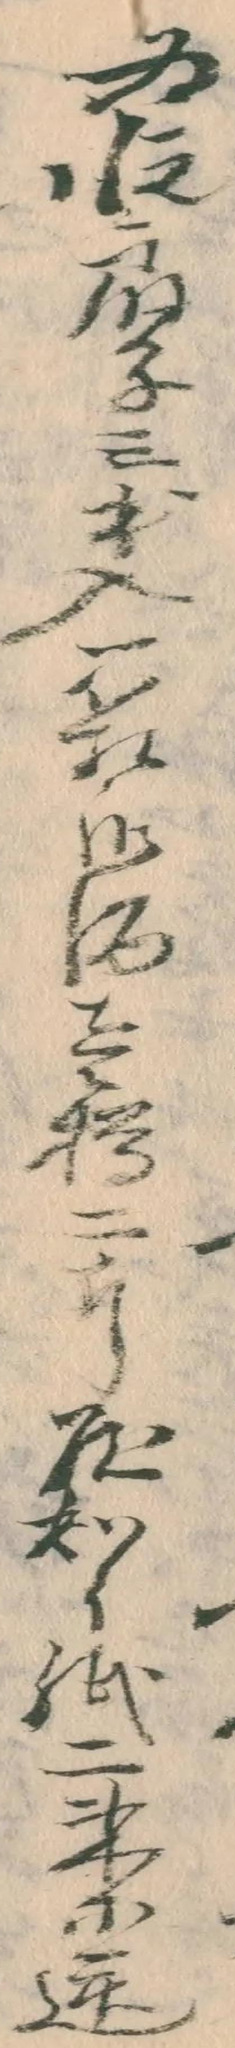為祝扇子三本入一箱御酒壱樽二升屋紙二束等送
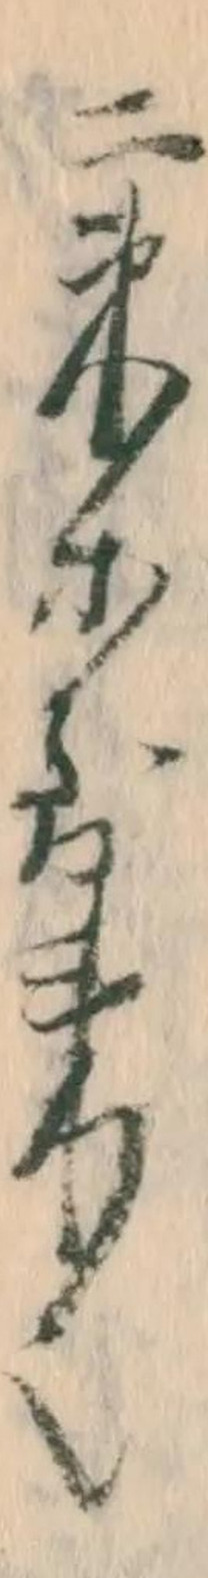二束等到来也
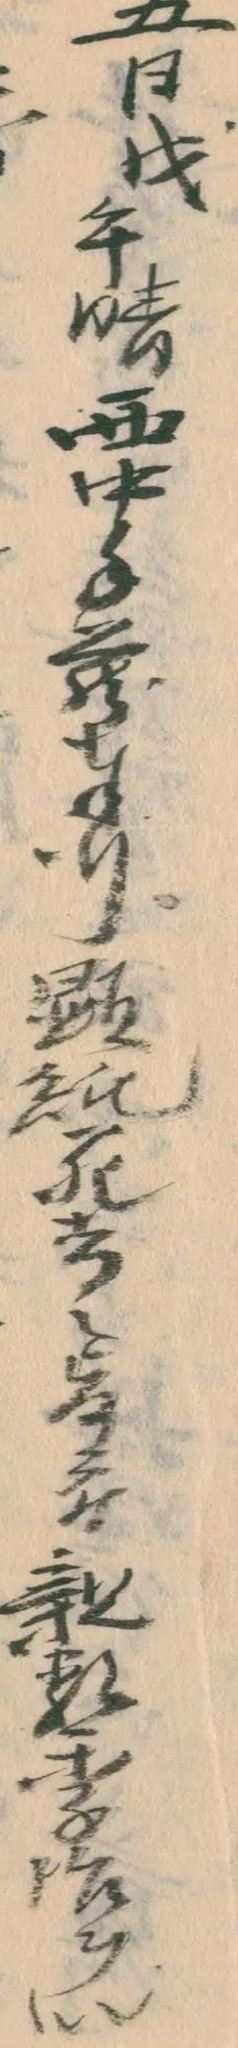五日戊午晴西中手蔵奉行顕純死去之旨ニ付親類季治ヲ以
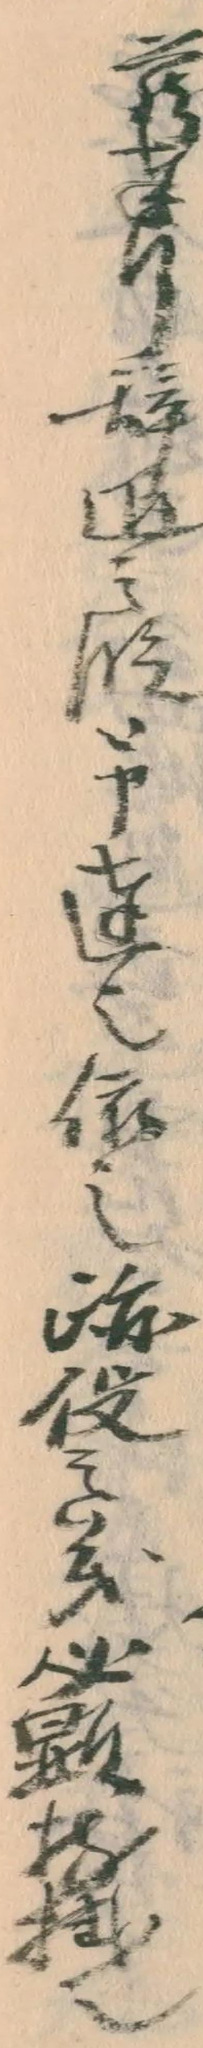蔵奉行辞退之段御申達也依之跡役之義必顕持掛也
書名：賀茂社記録. 第70冊
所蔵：国立国会図書館 National Diet Library, JAPAN
